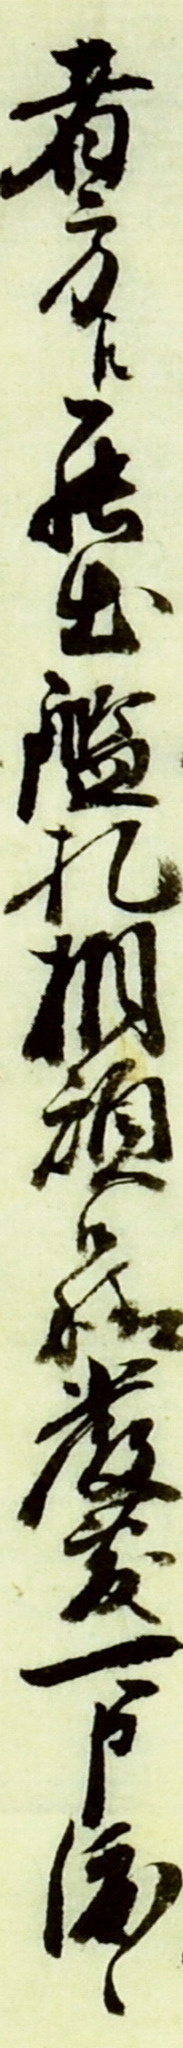者方江罷出鑑札相願候様厳敷可申渡候
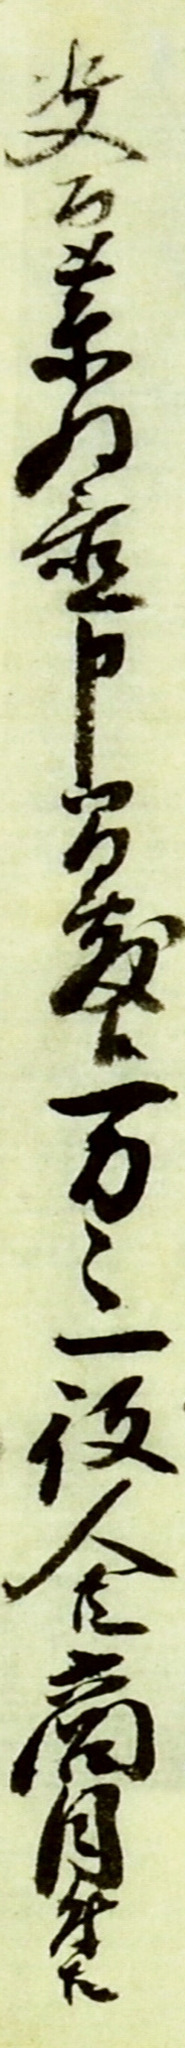決而薬為置申間敷候万々一役人共商目付共
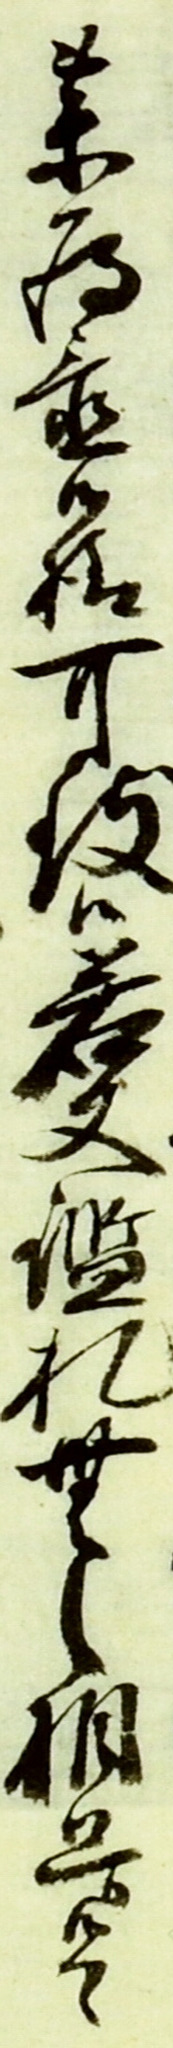薬為置候様可致候若又鑑札無之相廻り候ハヽ
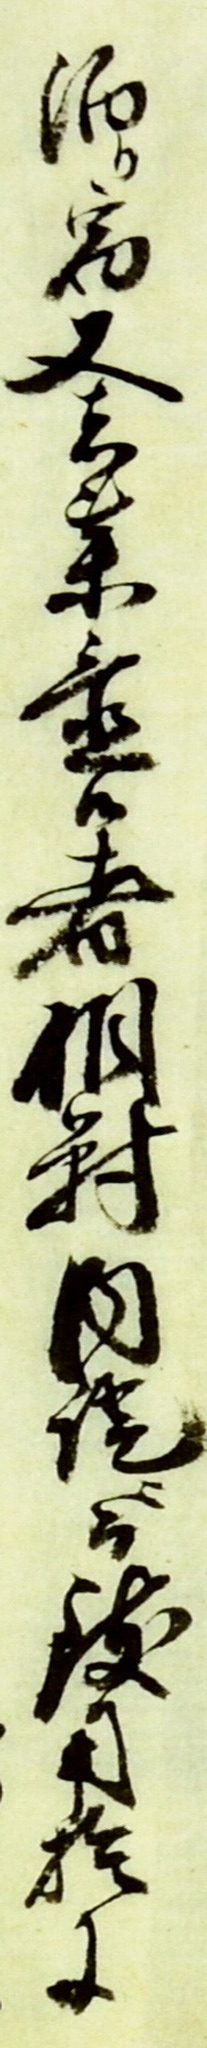泊り宿又者薬置候者相対内証ニ而致用捨に
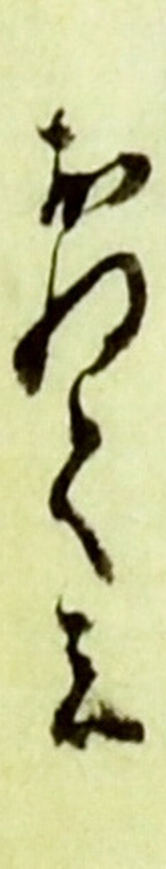おゐて者

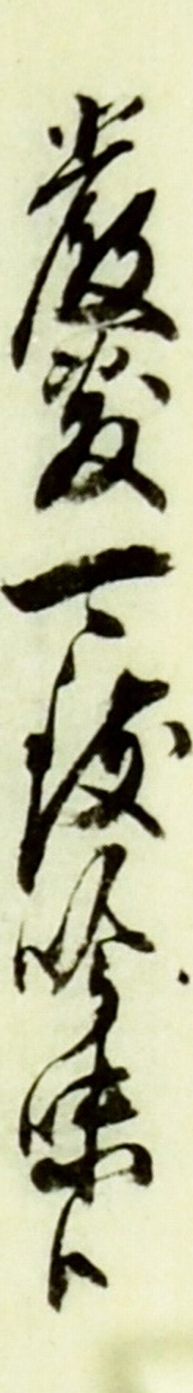厳敷可致吟味候
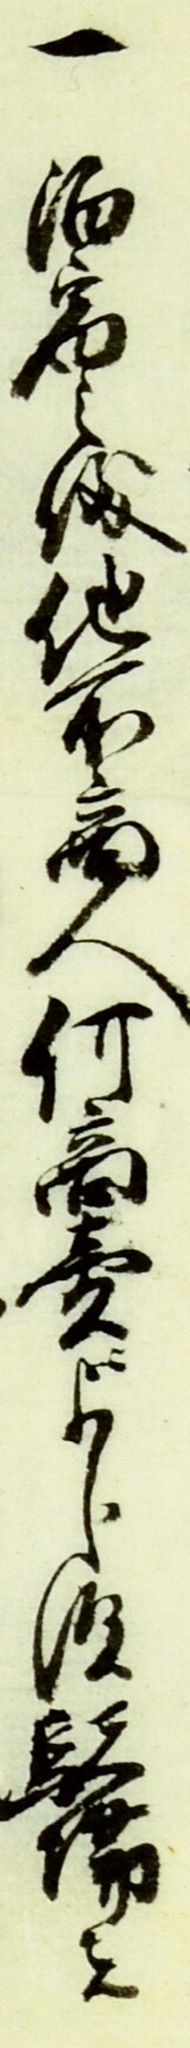一泊宿之儀他所商人何商売ニよらす駅場者
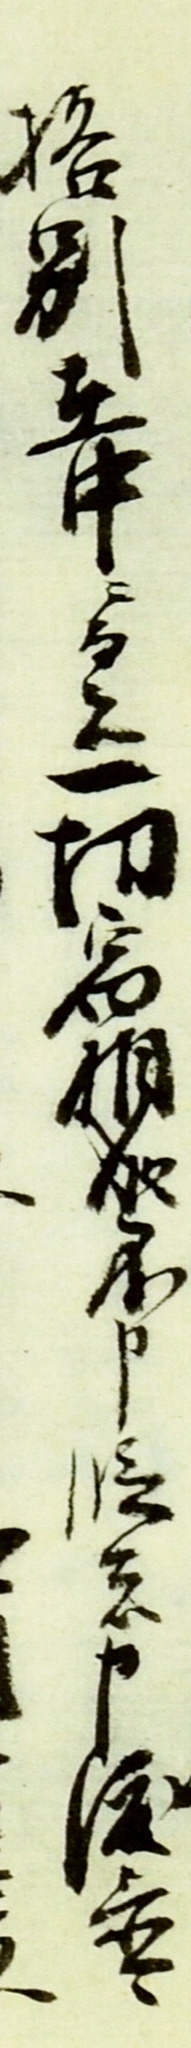格別在中ニ而者一切宿相成不申段者申渡置候
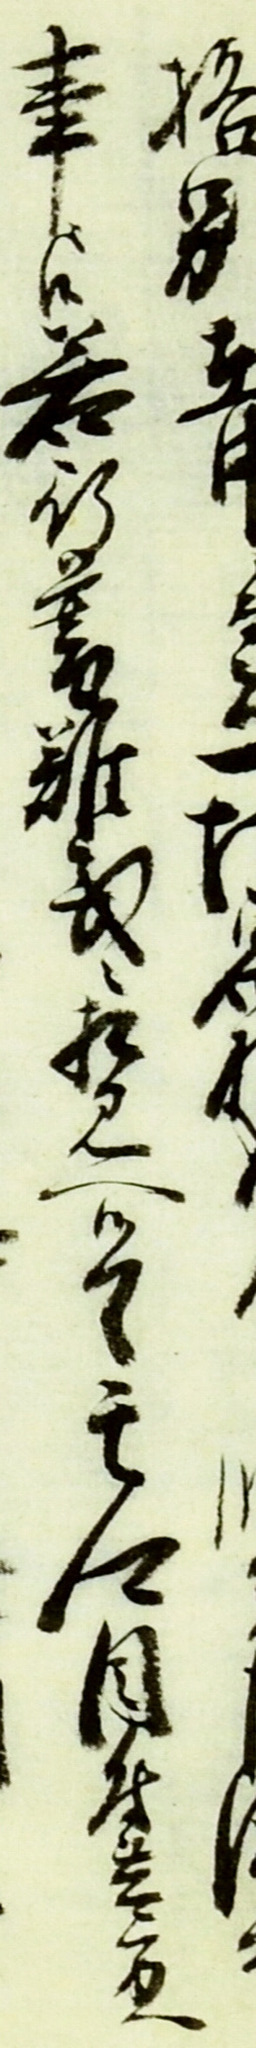事ニ候若行暮難義ニ相見へ候ハヽ其郷目付暮方へ
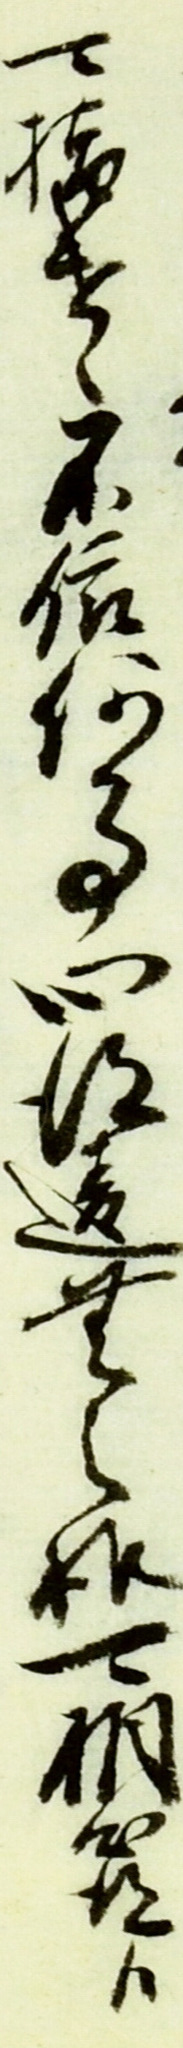可指遣候不依何事心得違無之様可相心得候
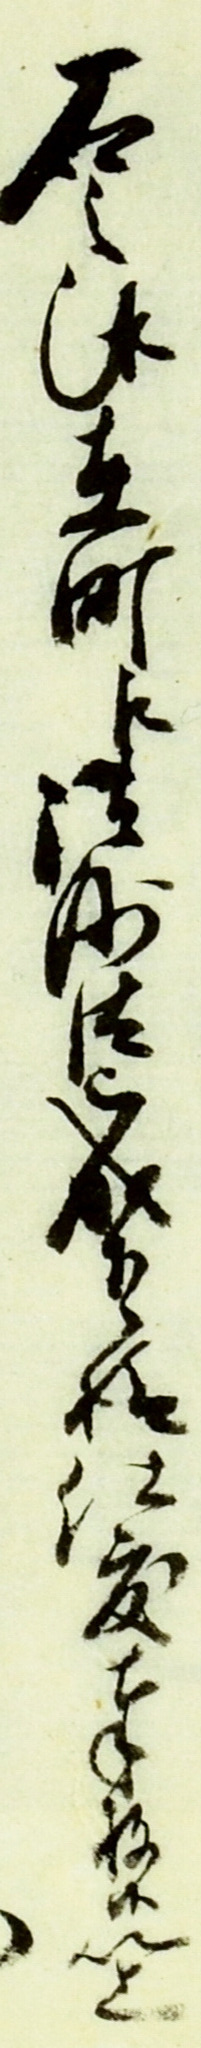右之趣在町江御沙汰被成下候様仕度奉存候以上
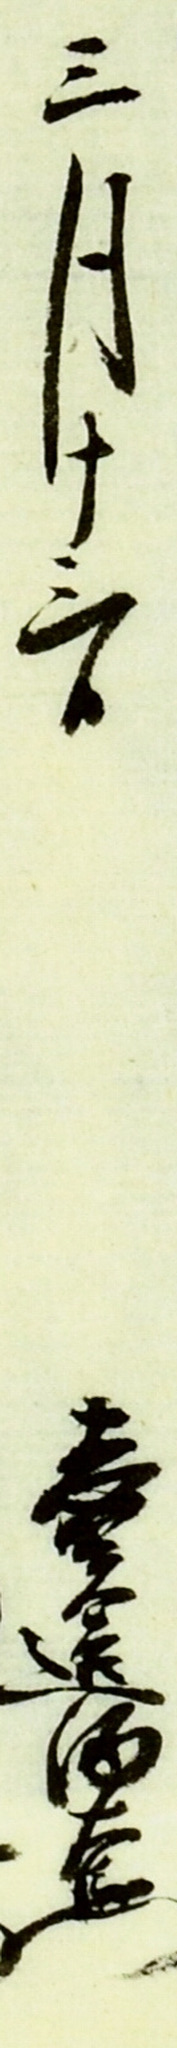三月十三日志賀造酒右衛門
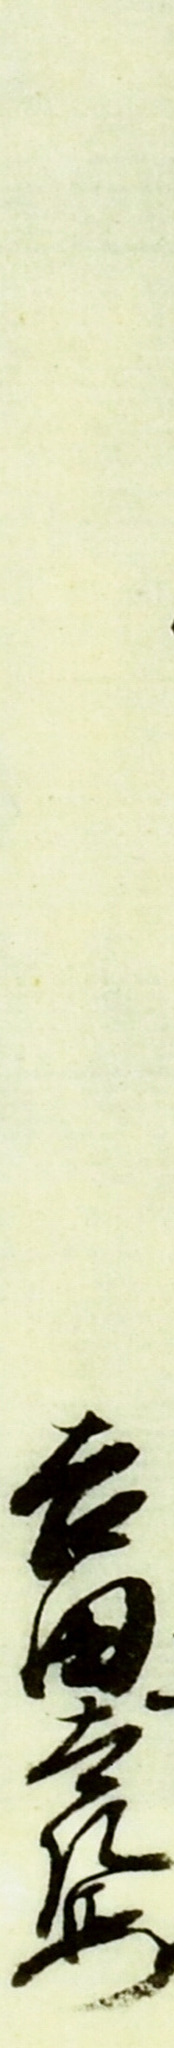吉田太左衛門
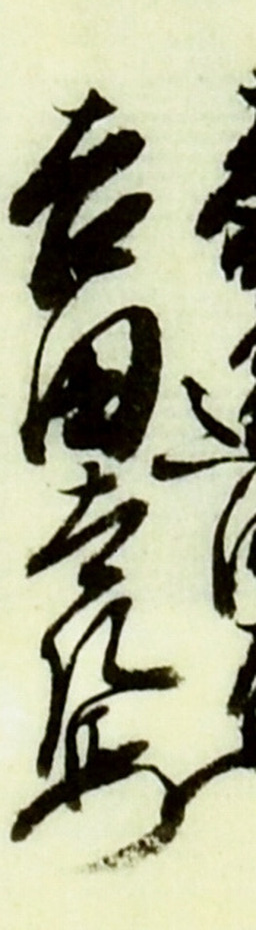吉田太左衛門
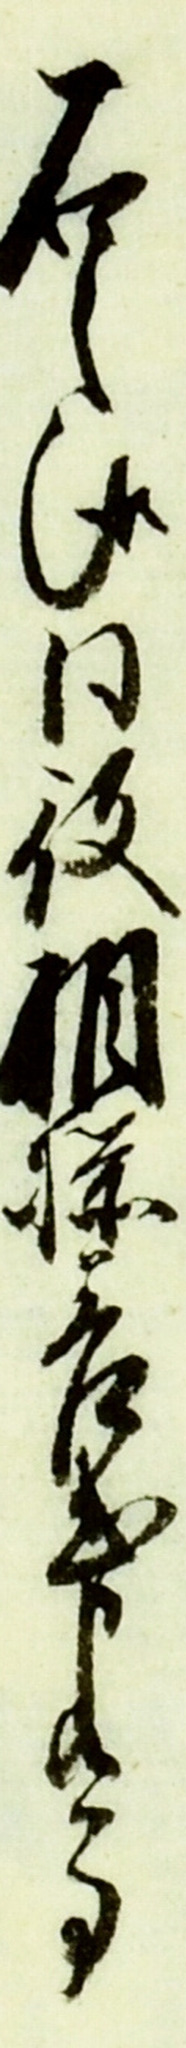右之趣同役相揃差出申候事
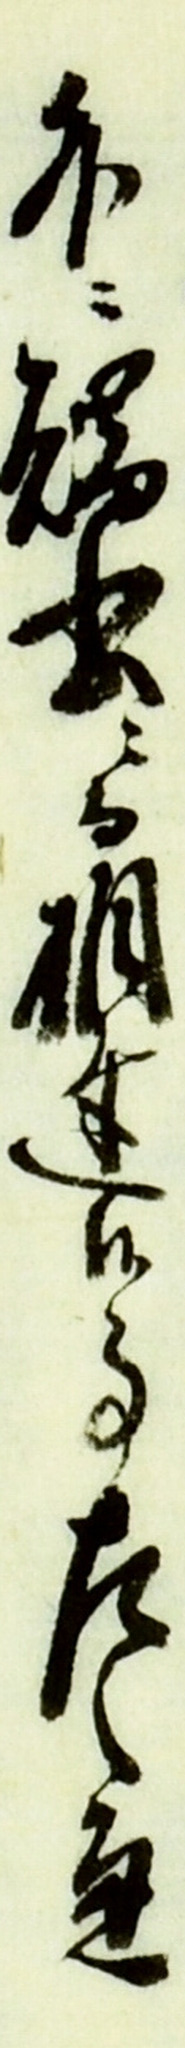外ニ端書ニ而相達候事左之通
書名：他国賣薬師運上之事
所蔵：伊那市立高遠町図書館・合同会社AMANE
